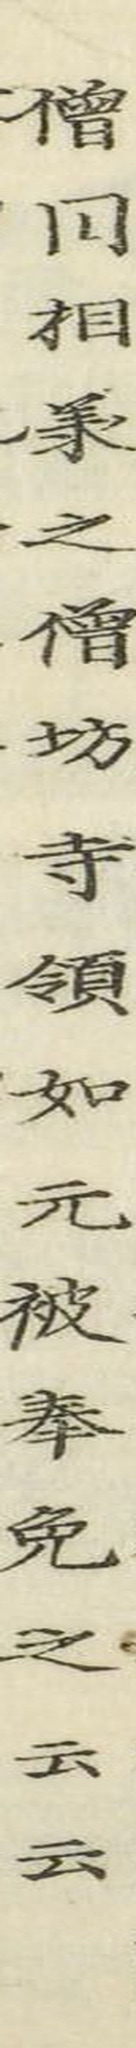僧同相承之僧坊寺領如元被奉免之云云
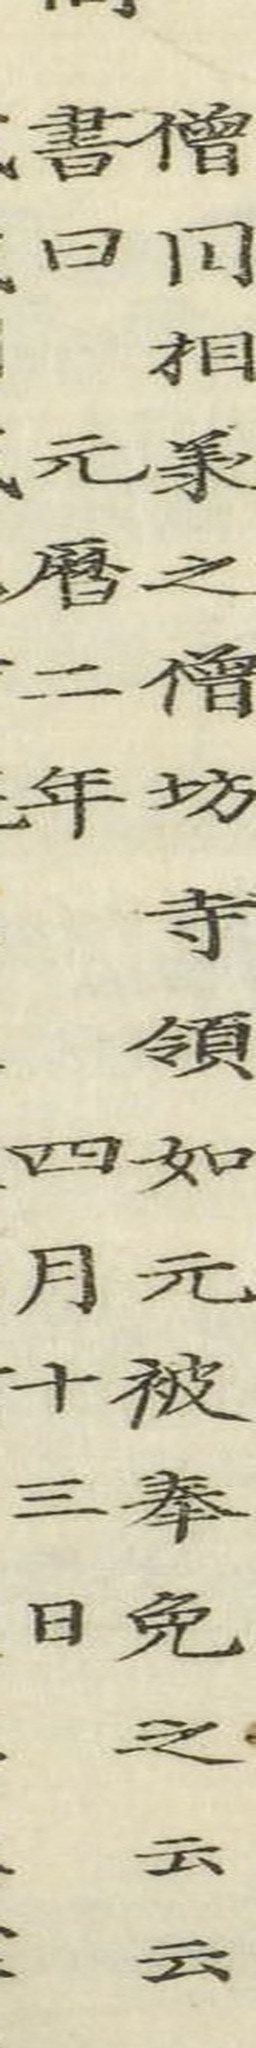同書曰元歴二年四月十三日
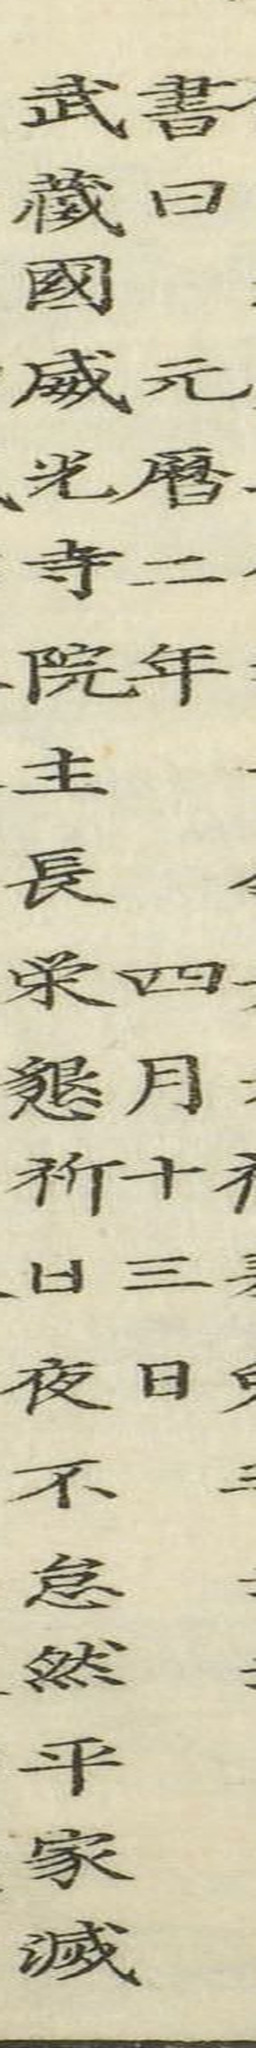武蔵国威光寺院主長栄懇祈日夜不怠然平家滅
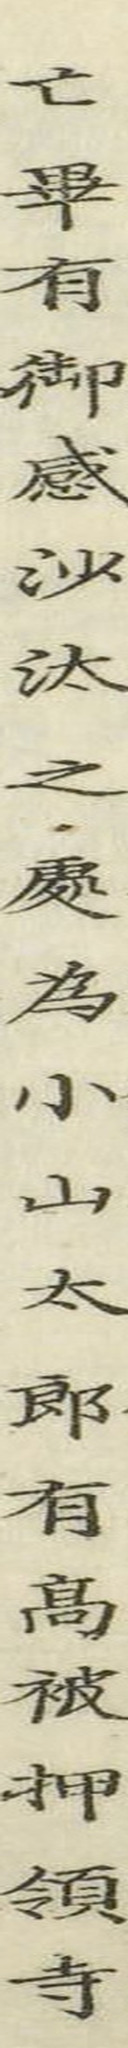亡畢有御感沙汰之處為小山太郎有高被押領寺
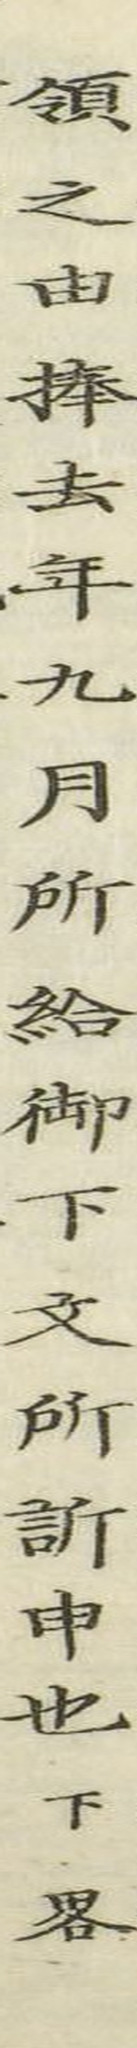領之由捧去年九月所給御下文所訴申也下略
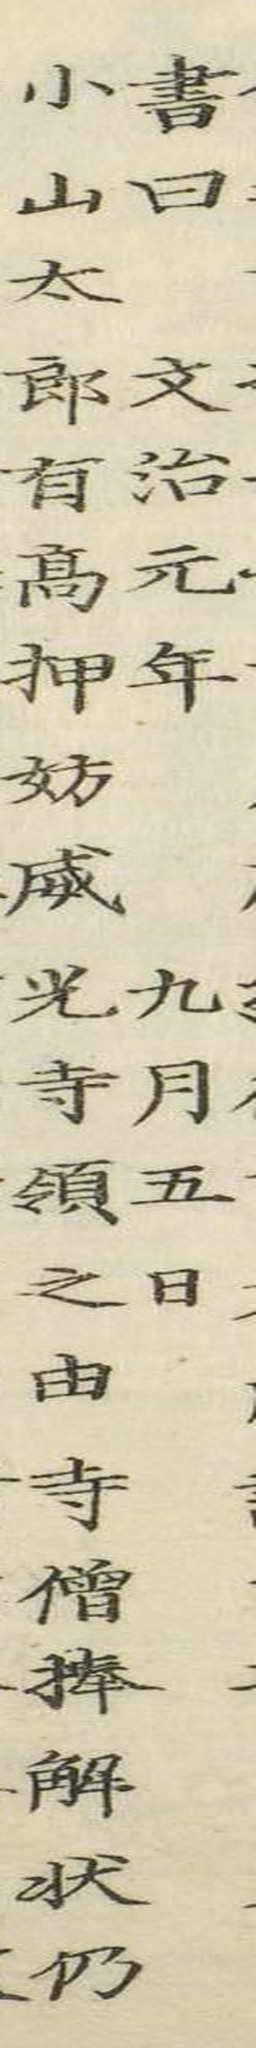小山太郎有高押妨威光寺領之由寺僧捧解状仍
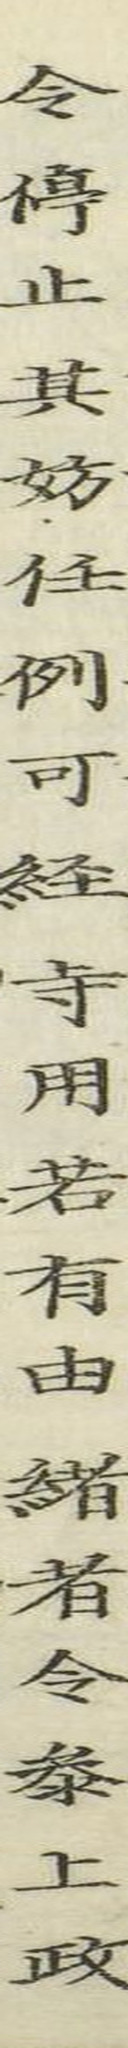令停止其妨任例可経寺用若有由緒者令参上政
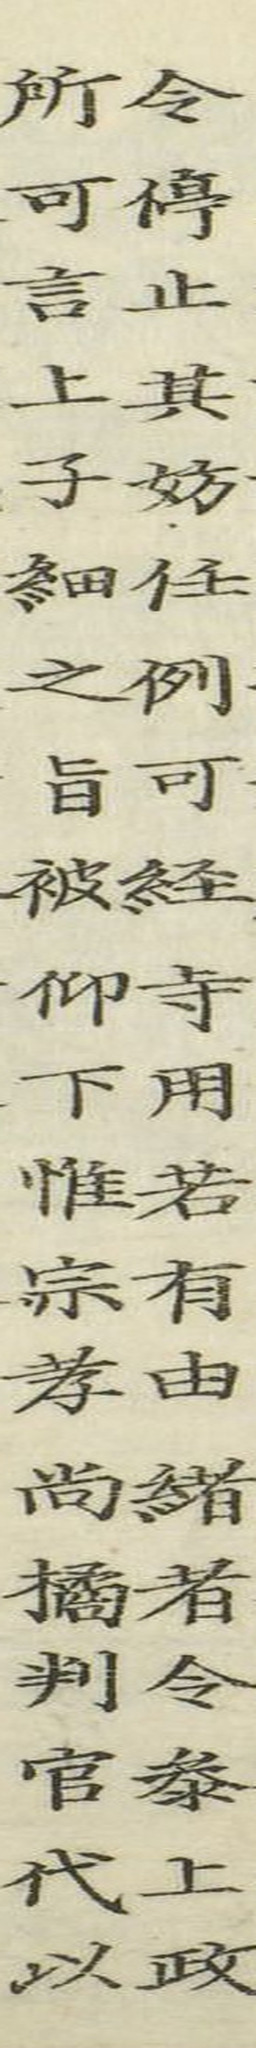所可言上子細之旨被仰下惟宗孝尚橘判官代以
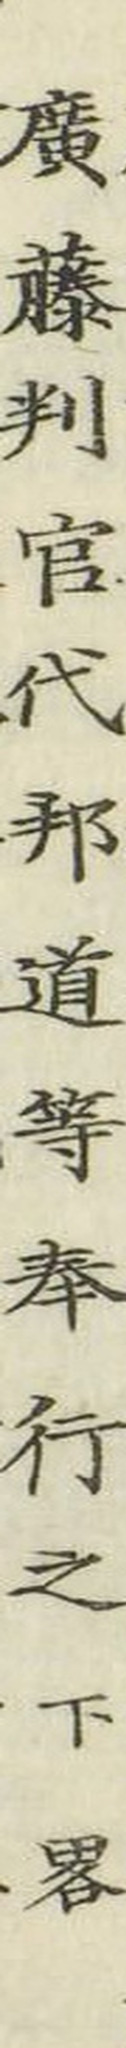広藤判官代邦道等奉行之下略
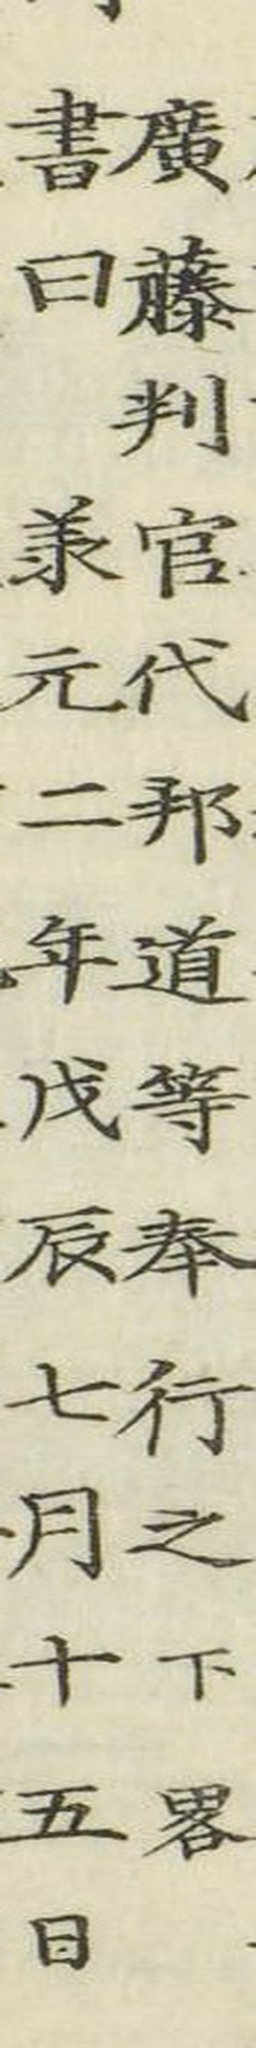同書曰承元二年戊辰七月十五日
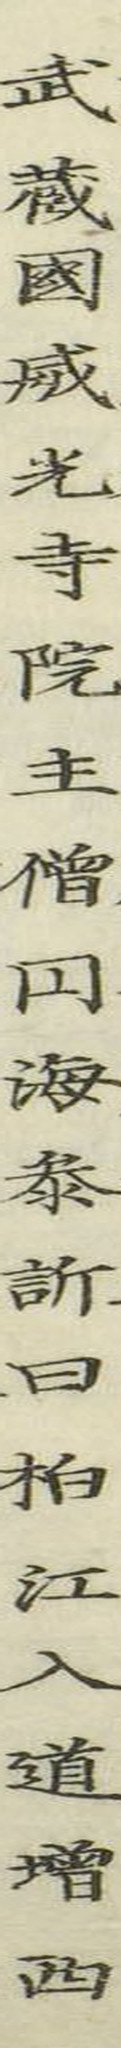武蔵国威光寺院主僧円海参訴曰柏江入道増西
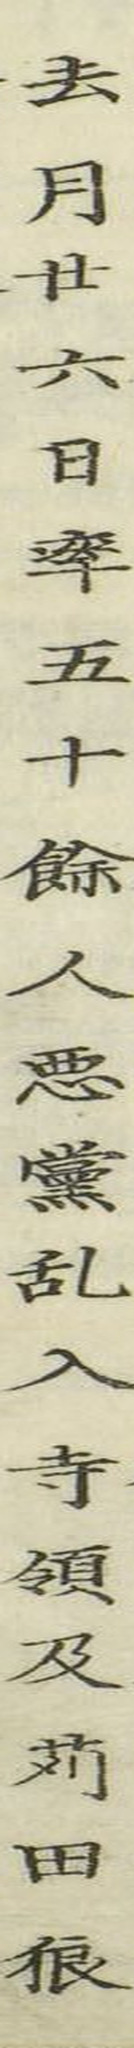去月廿六日率五十余人悪党乱入寺領及苅田狼

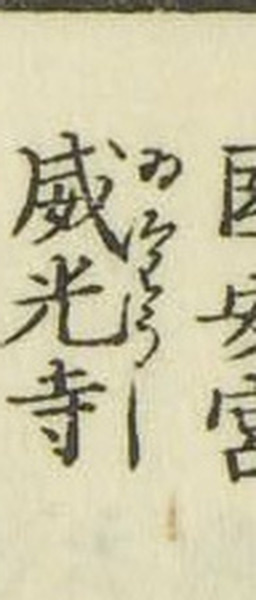威光寺
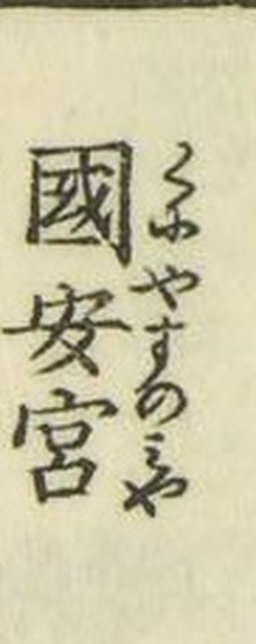国安宮
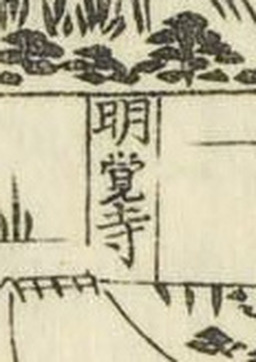明覚寺
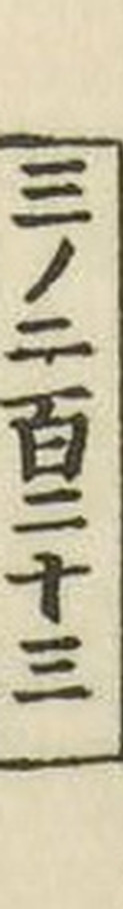三ノ二百二十三
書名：江戸名所図会 20巻 巻之10
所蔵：東京学芸大学教育コンテンツアーカイブ
